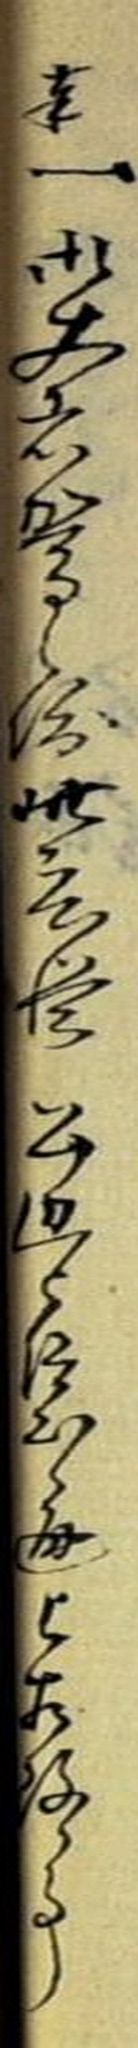奉一御使者駕之儀此度従公辺被仰出候通被相改候事
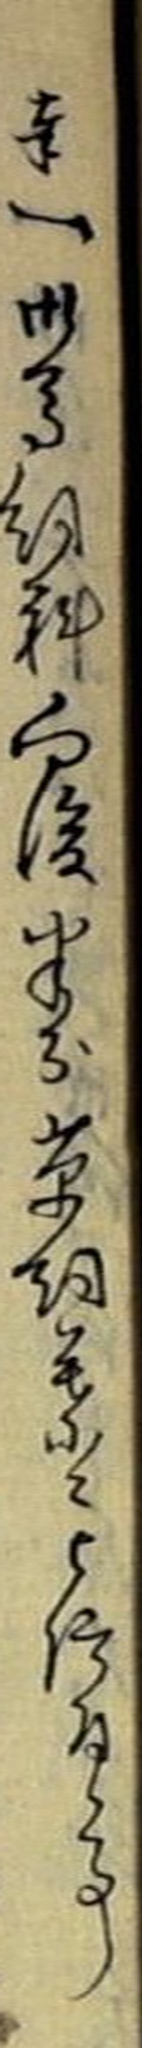奉一御馬飼料向後半分草飼葉に被仰付候事
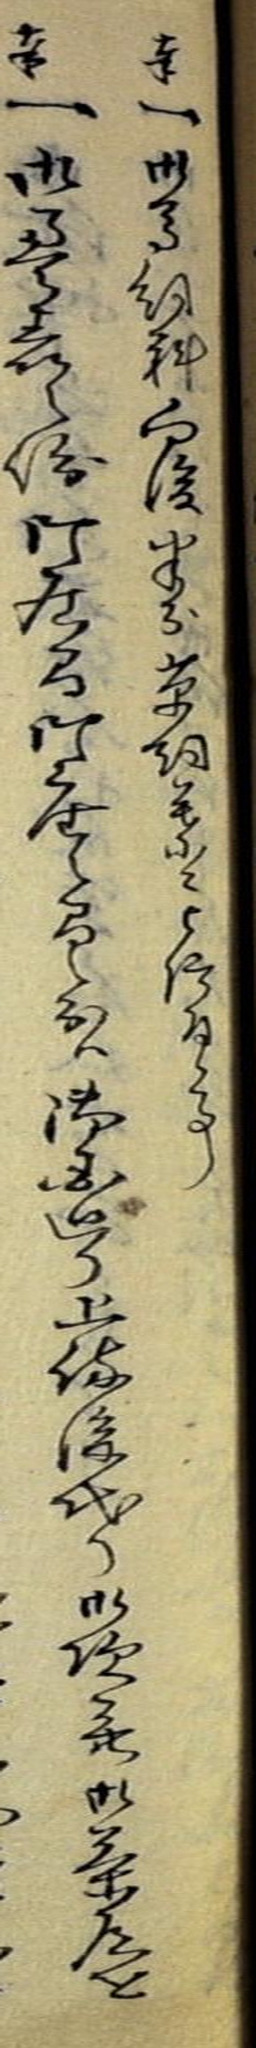奉一御畳表之儀御居間御座之間之分は御国廻り上備後代り御次并御茶屋を
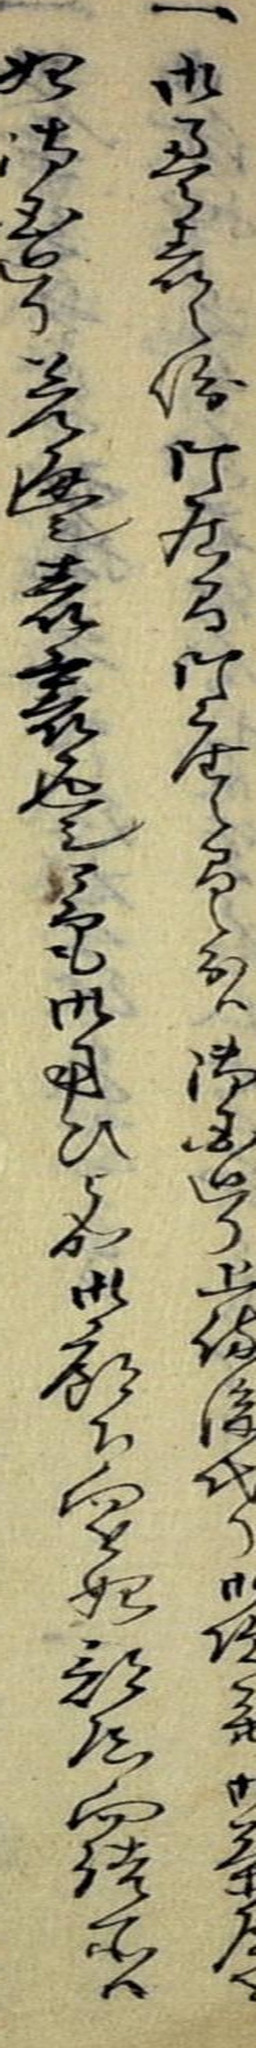始御国廻り差通し表裏返しに而も御用ひ被成御廊下向を始部屋向詰所は
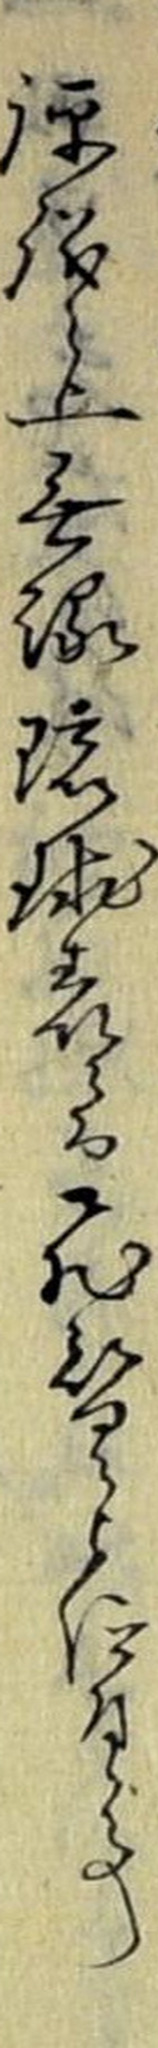評議之上無縁琉球表に而作替に被仰付候事
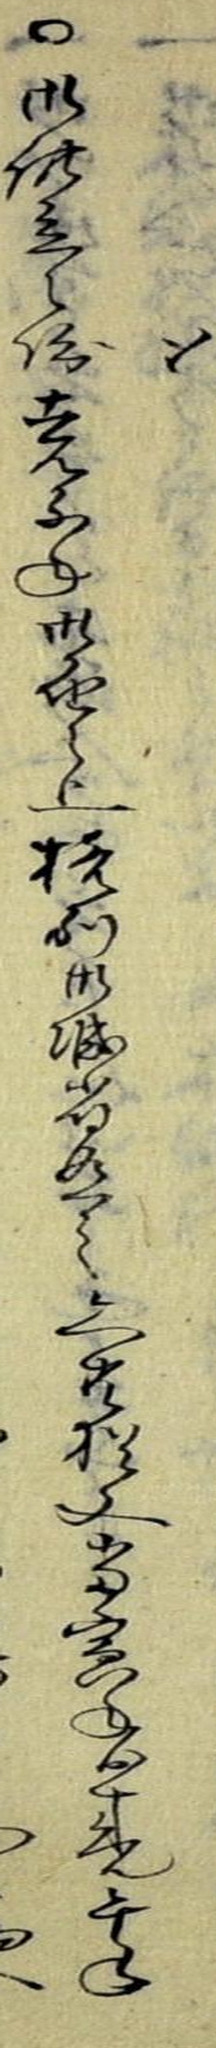○御供立之儀去ル子年御届之上各別御減省有之候へ共猶又当寅年ゟ来ル午年
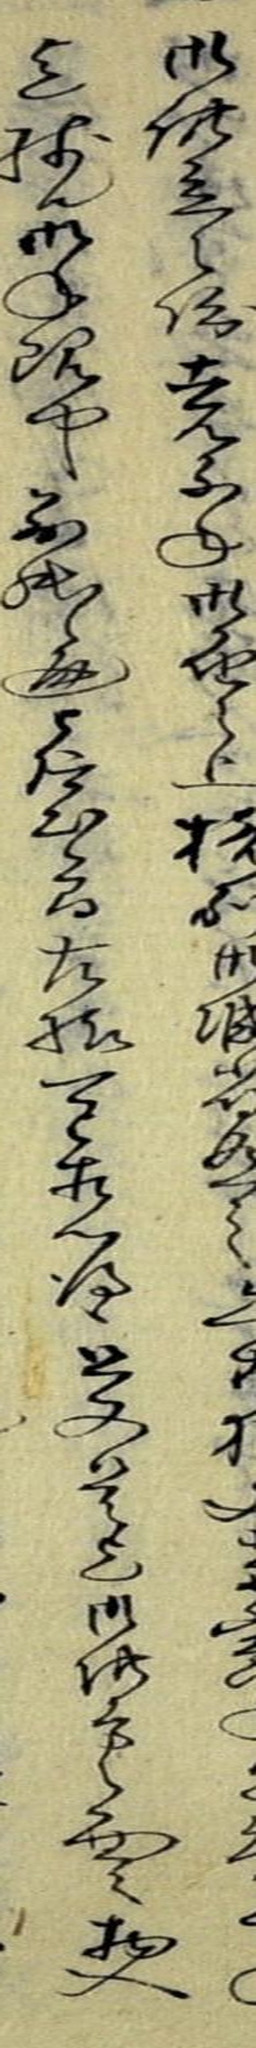迄残る御年限中別紙之通被仰出候間左様可被相心得候且又是迄御供方之面々物入
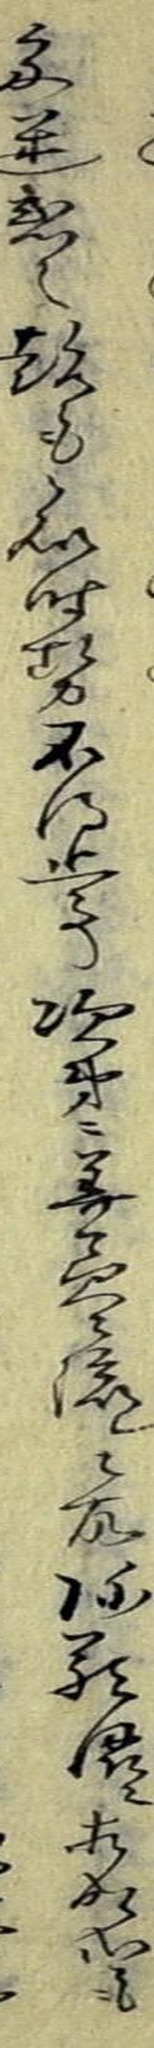多迷惑之趣も候処時勢不得止事次第に華美に流レ候故弥難渋に相成哉にも
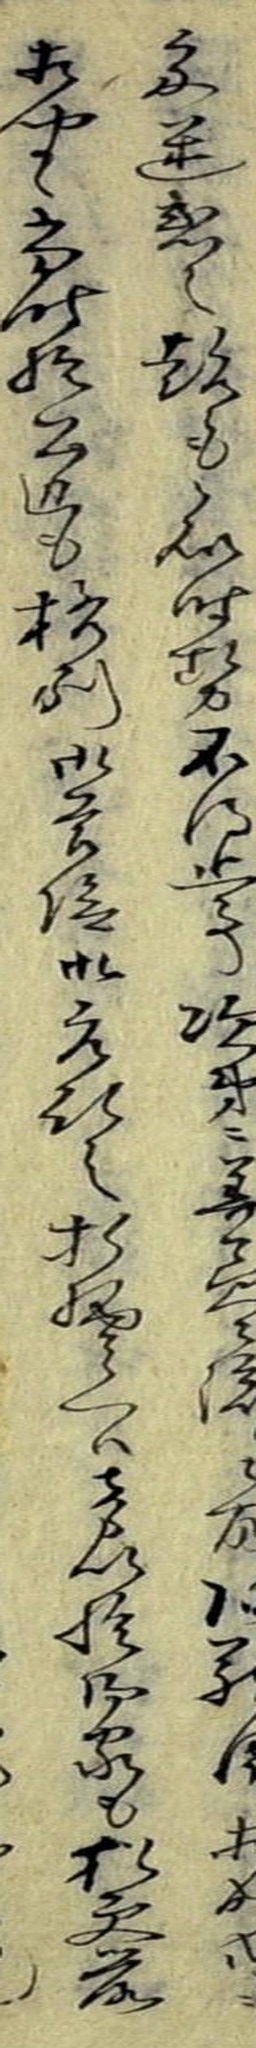相聞候当時於公辺も各別御節倹御取行之折柄に候へは旁以於御家も猶更厳
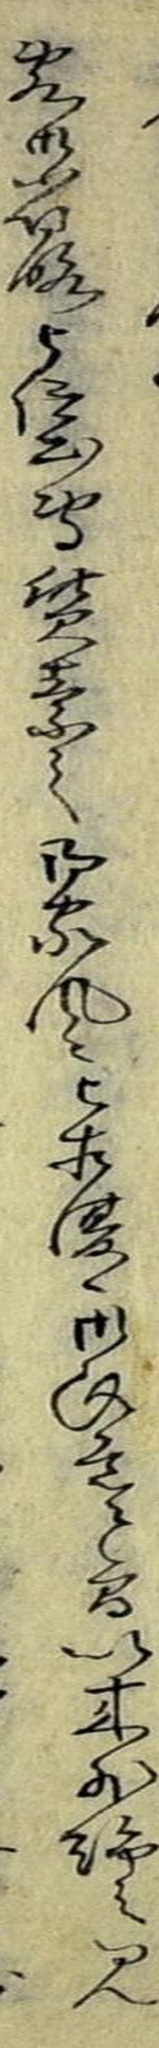敷御省略被仰出専質素之御家風に被相復候御趣意に候間以來外飾之見
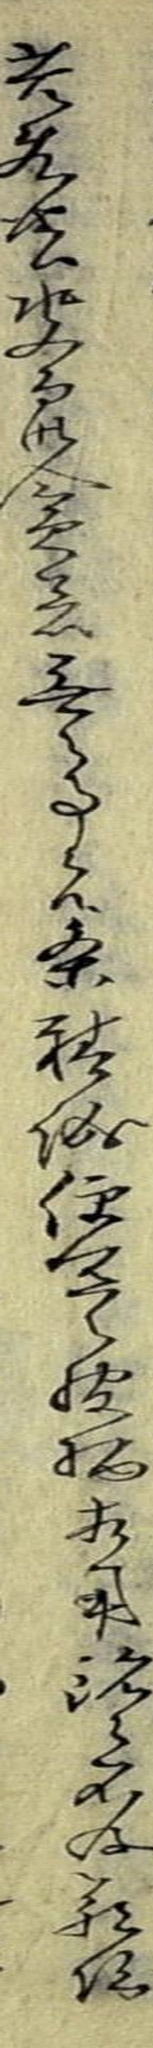苦敷儀は決而御貧着無之事に候条精誠便宜之服柄相用銘々不及難儀
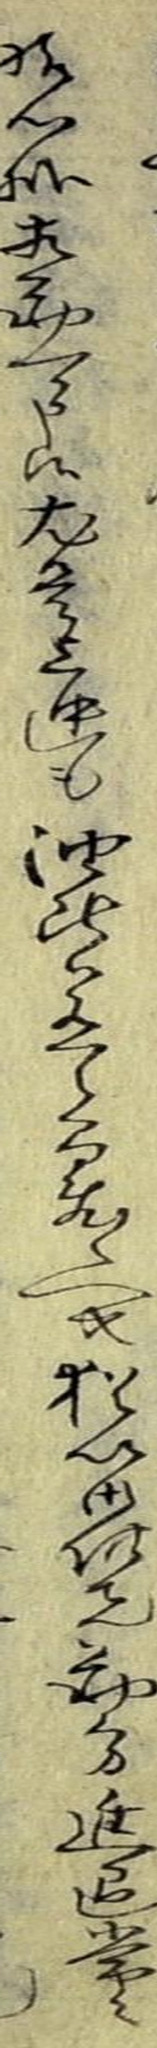様心掛相勤可申候尤是迄迚も由断は有之間敷候へ共猶以御供先勤方進退常々
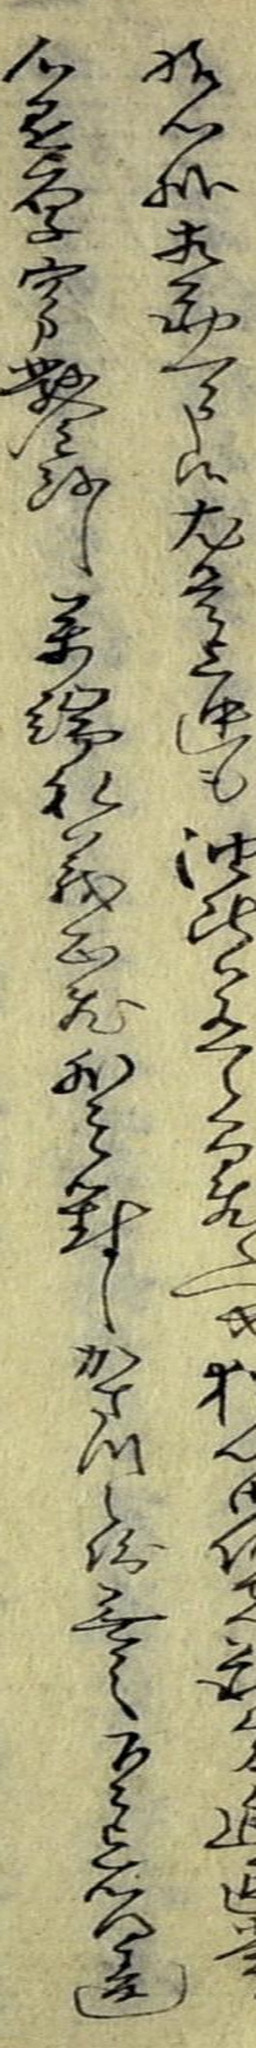心懸厚穿鑿致し万端礼義正敷外々へ対しかさつ之儀無之下々迄心得違
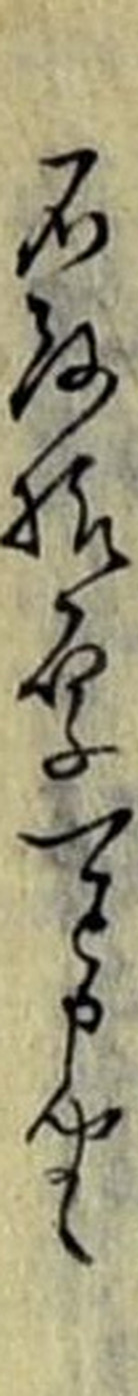不致様厚可被申聞候
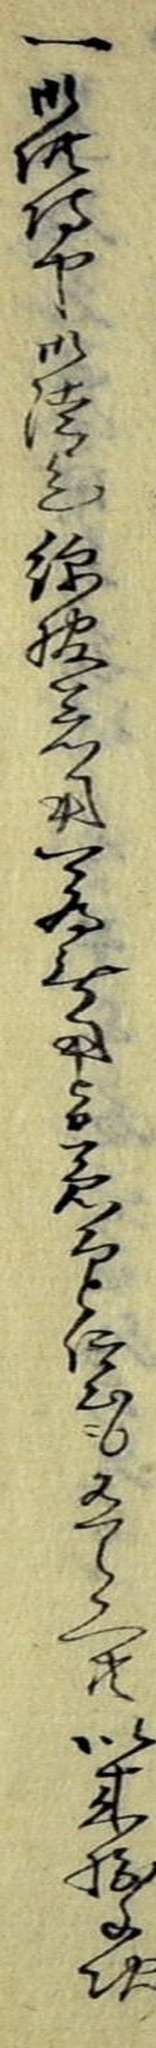一御供侍中御徒迄綿服着用可為無用旨兼而被仰出も有之候へ共以来勝手次

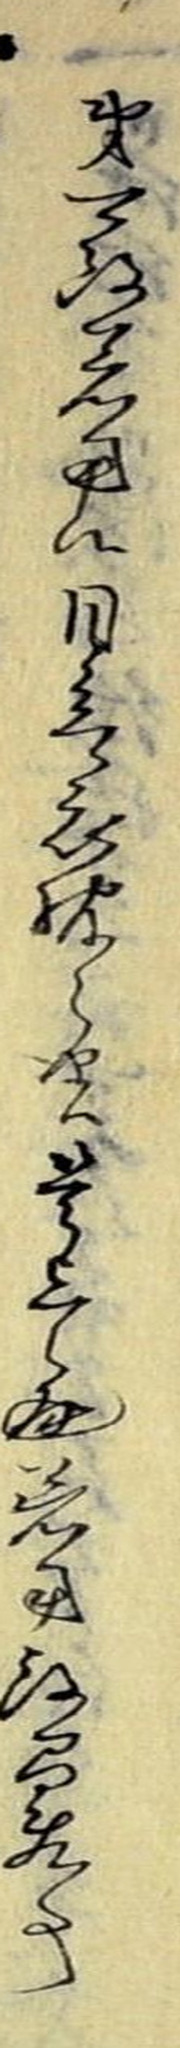第可致着用候目立候衣服之儀は是迄之通着用致間敷事
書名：命令之部 六
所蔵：福井県文書館 Fukui Prefectural Archives
